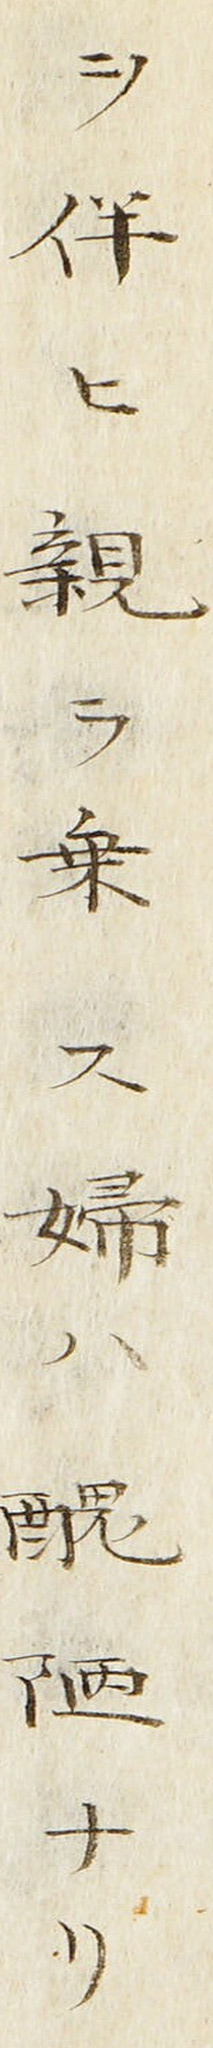ヲ伴ヒ親ラ乗ス婦ハ醜陋ナリ
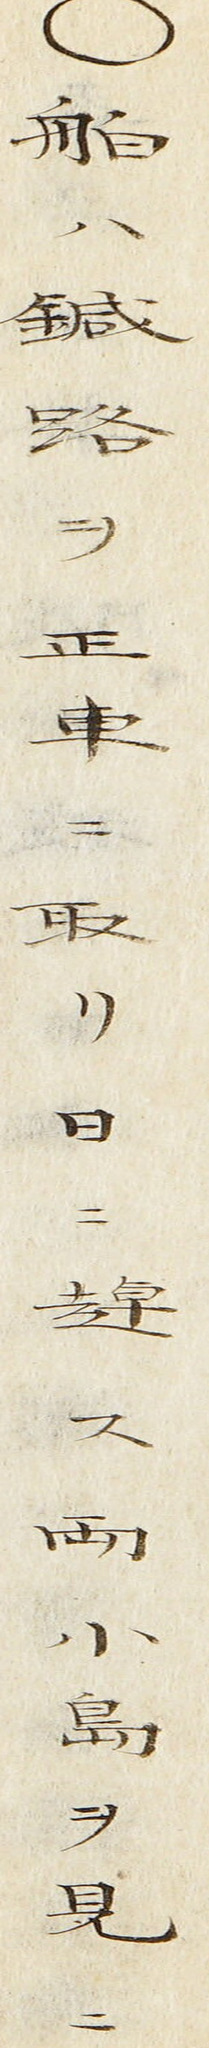○舶ハ鍼路ヲ正車ニ取リ日に趠ス両小島ヲ見ニ
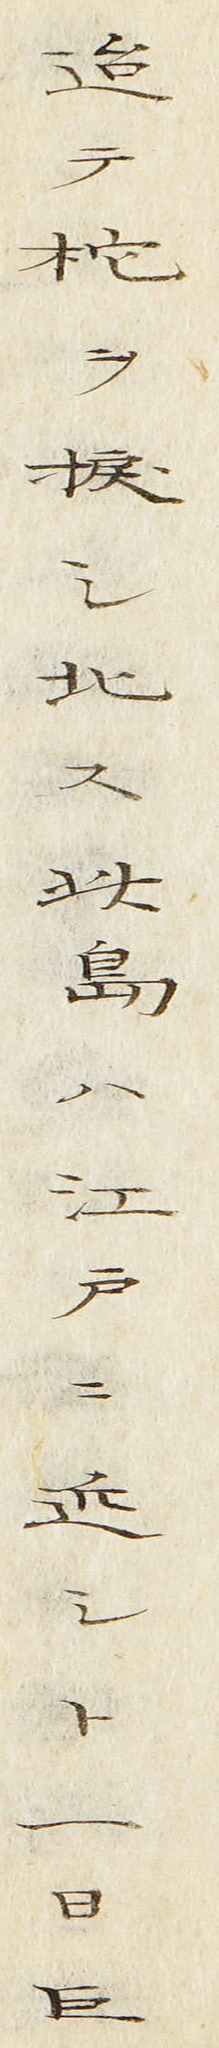迨テ舵ヲ捩シ北ス此島ハ江戸ニ近シト一日巨
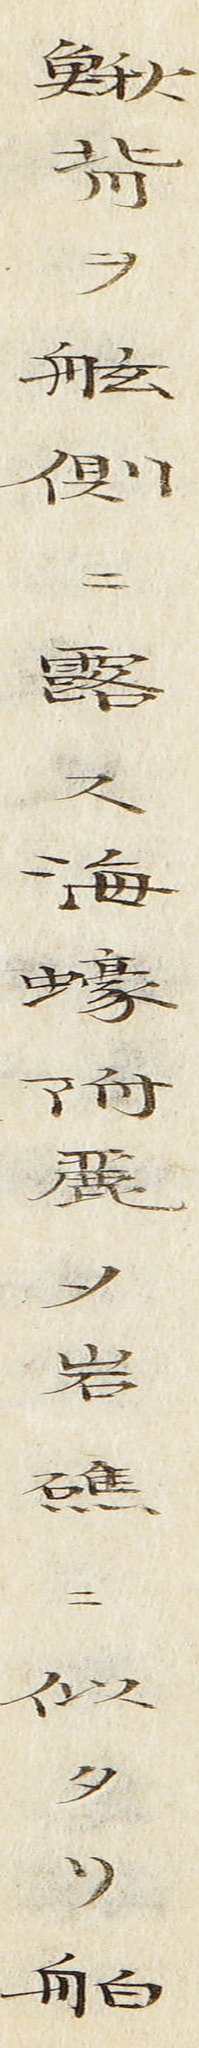鰍背ヲ舷側ニ露ス海蠔附麗シテ岩礁ニ似タリ舶
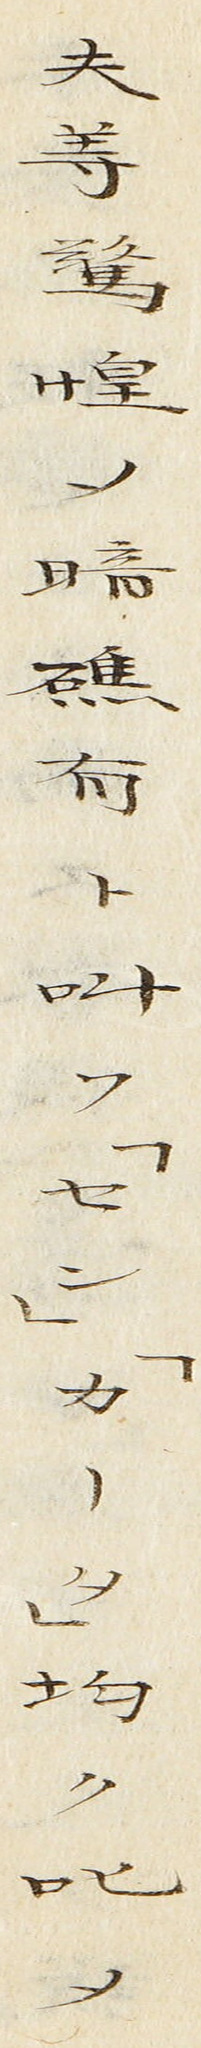夫等驚惶シテ暗礁有ト叫フ「セン」「カータ」均ク叱シテ
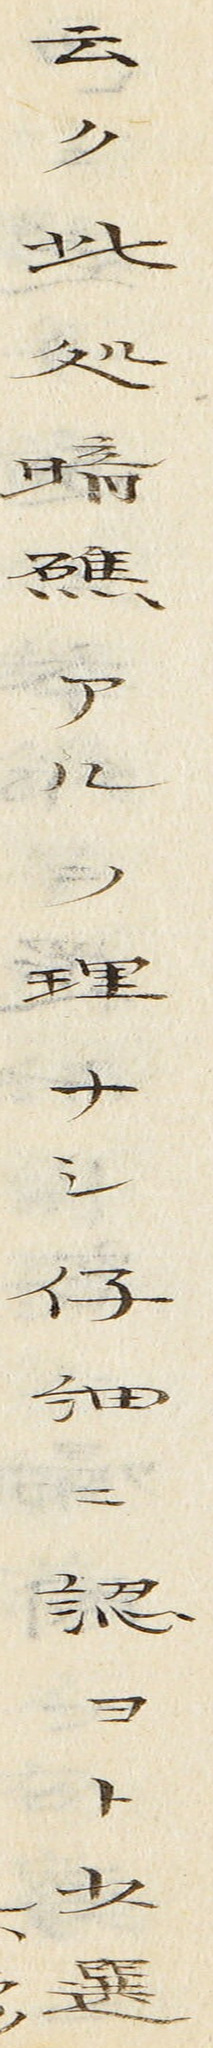云ク此処暗礁アルノ理ナシ仔細ニ認ヨト少選
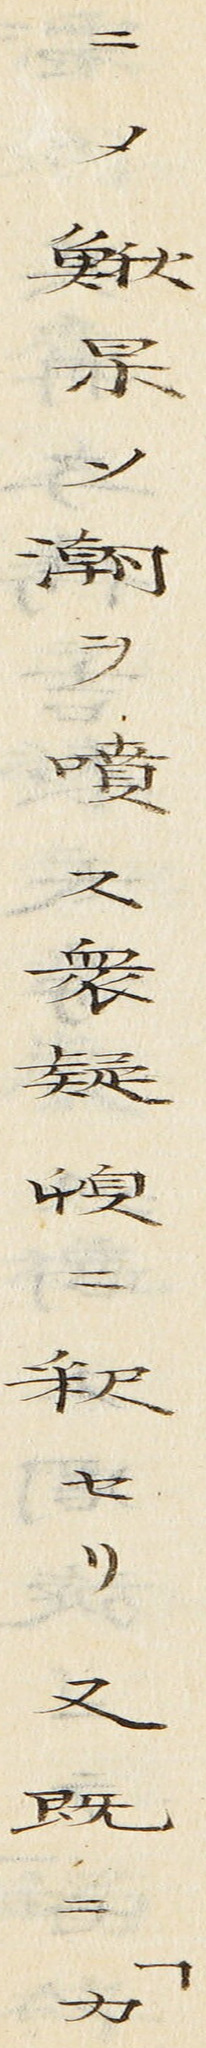ニシテ鰍果シテ潮ヲ噴ス衆疑頓ニ釈セリ又既ニ「カ
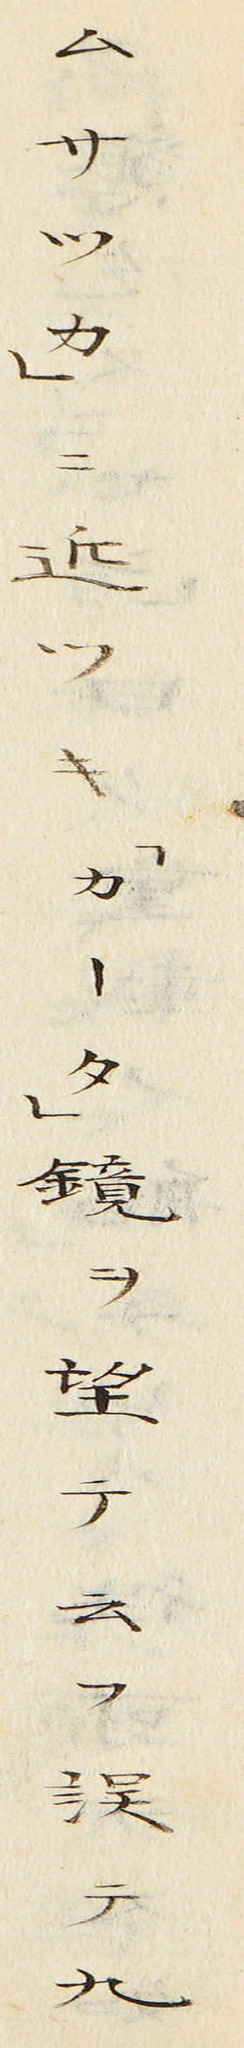ムサツカ」ニ近ツキ「カータ」鏡ヲ望テ云フ誤テ九
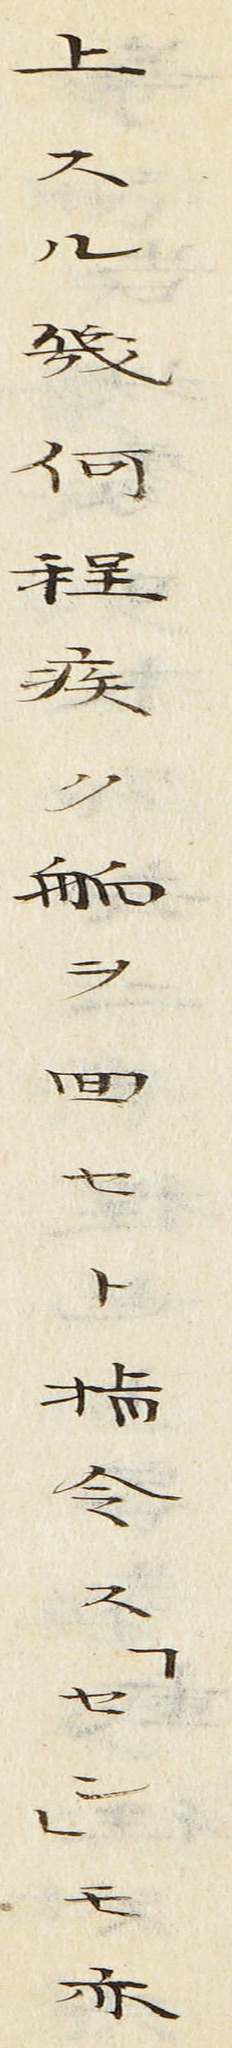上スル幾何程疾ク舶ヲ回セト指令ス「セン」モ亦
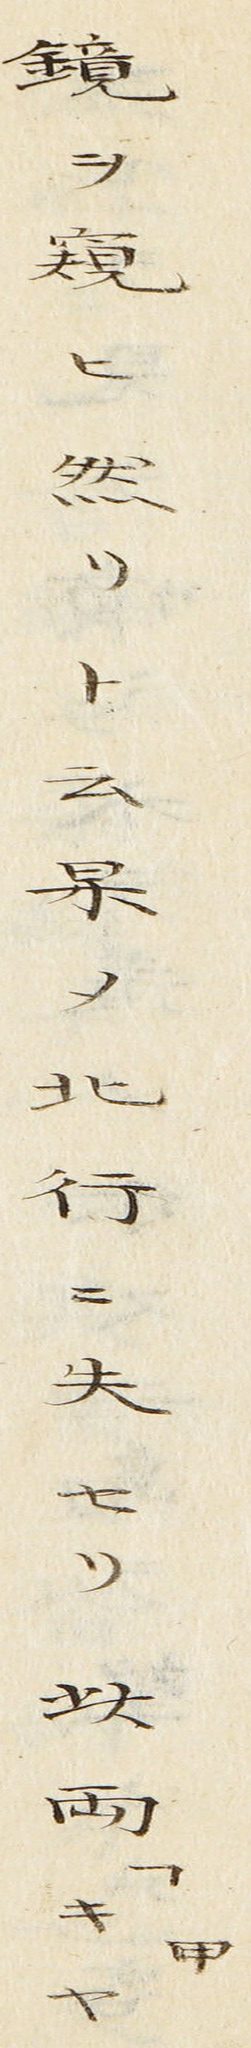鏡ヲ窺ヒ然リト云果シテ北行ニ失セリ此両「キヤ
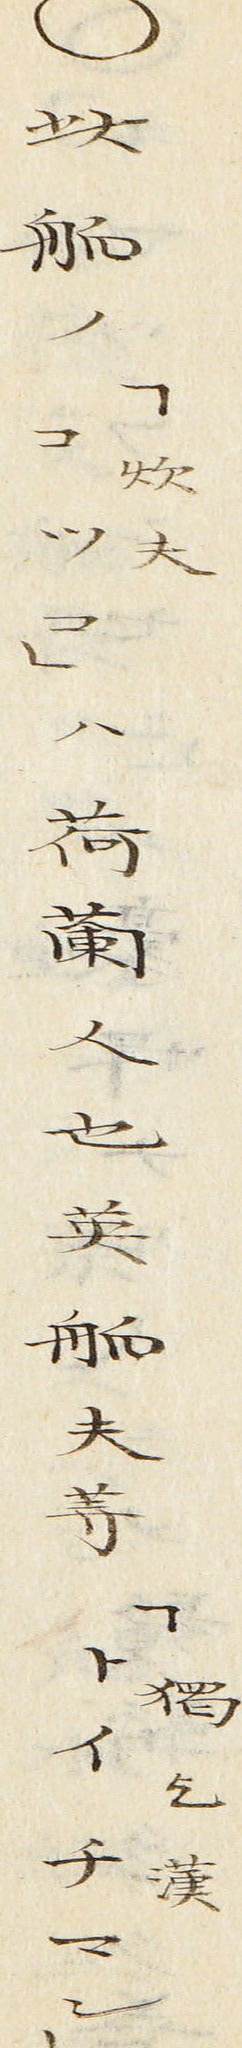○此舶ノ「コツコ」ハ荷蘭人也英舶夫等「トイチマン」
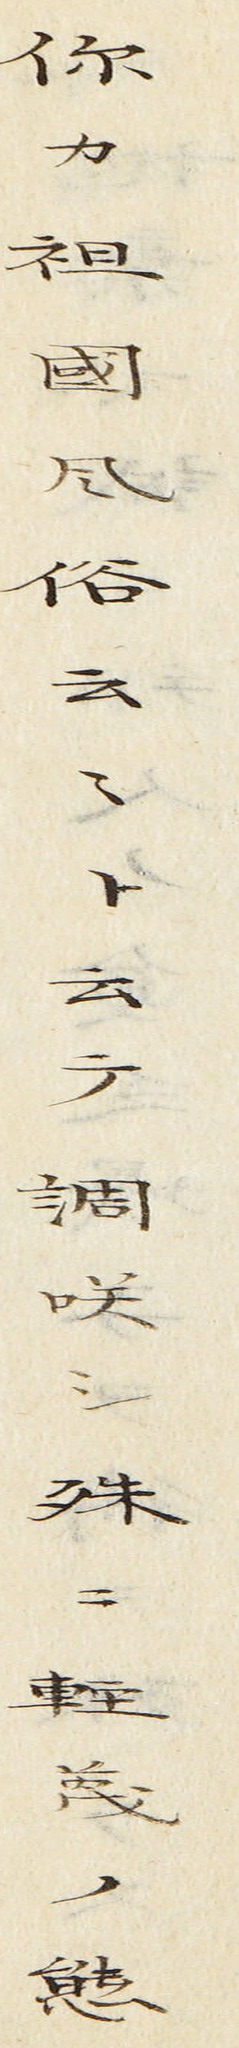你カ祖国風俗云々ト云テ調咲シ殊ニ軽蔑ノ態
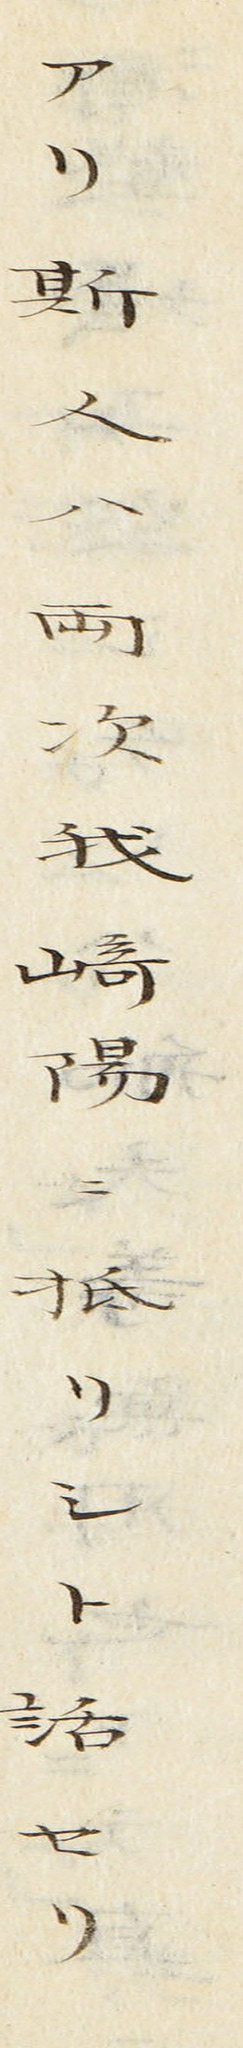アリ斯人ハ両次我崎陽ニ抵リシト話セリ
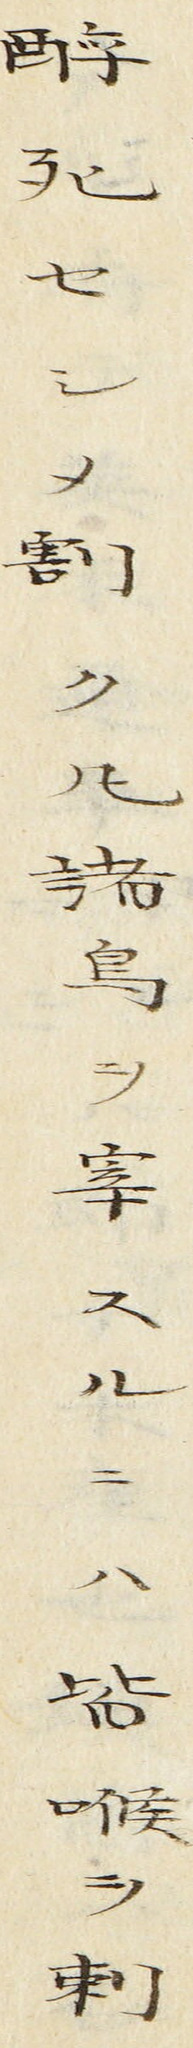酔死セシメ割ク凡諸鳥ヲ宰スルニハ皆喉ヲ刺

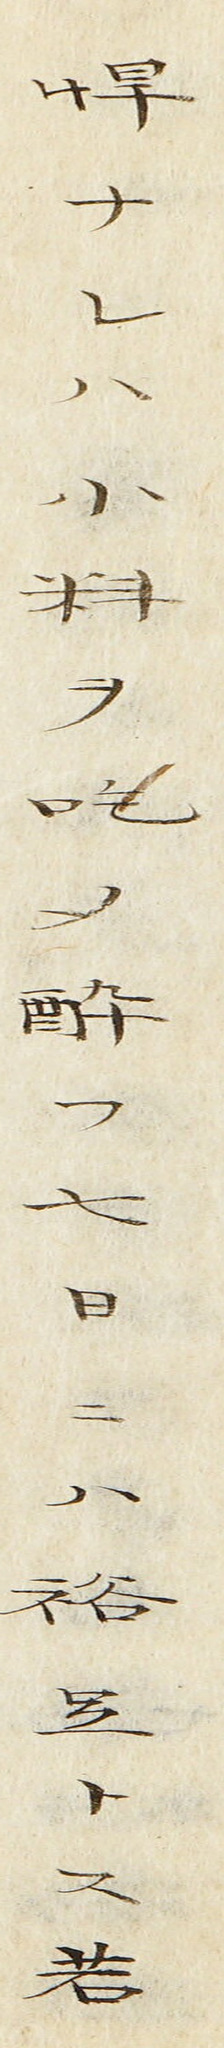悍ナレハ小料ヲ吃シテ酔フ七日ニハ裕足トス若
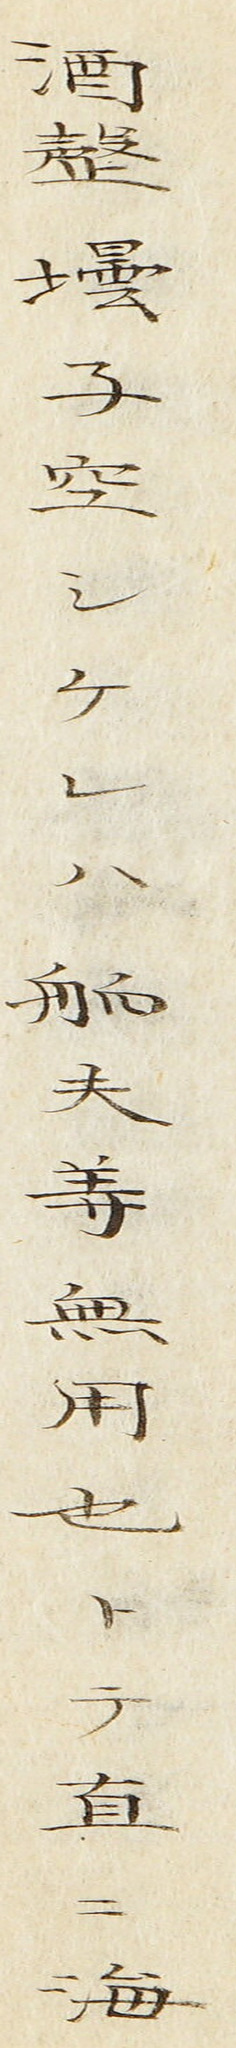酒壜子空シケレハ舶夫等無用也トテ直ニ海
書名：蕃談
